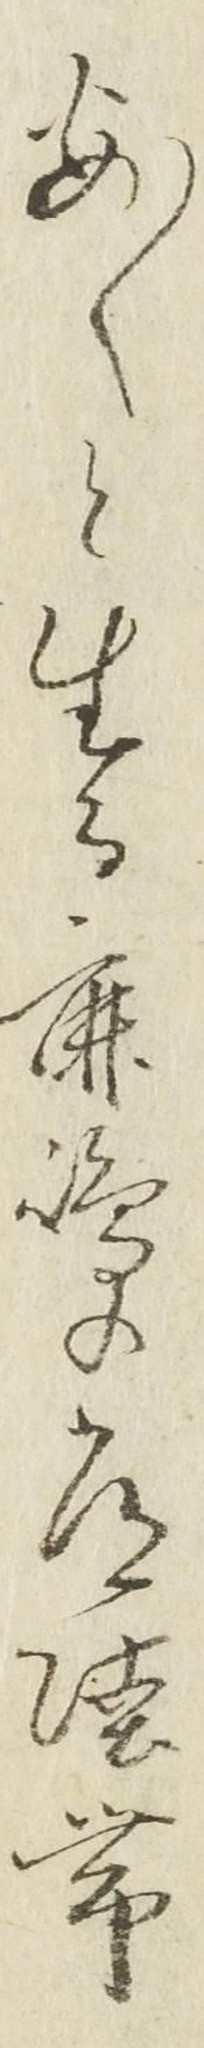安々と生る鹿嶋の常陸帯
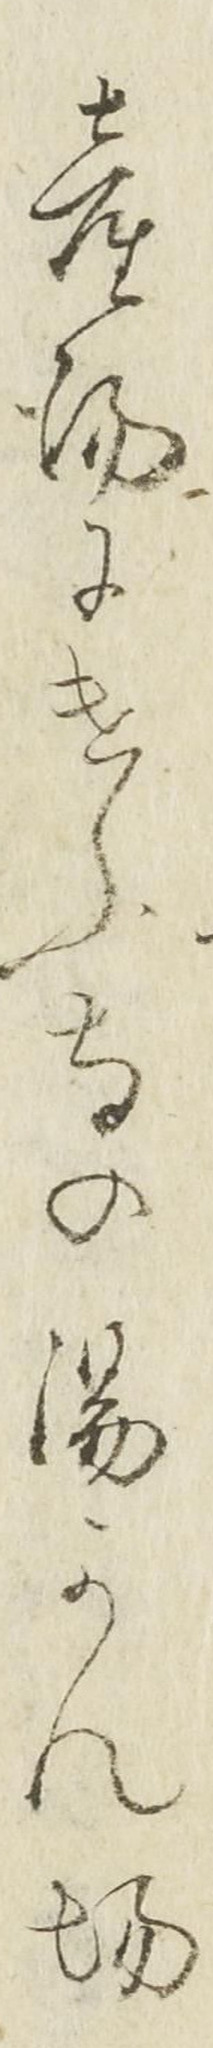産湯に遣ふ寺の湯かん場
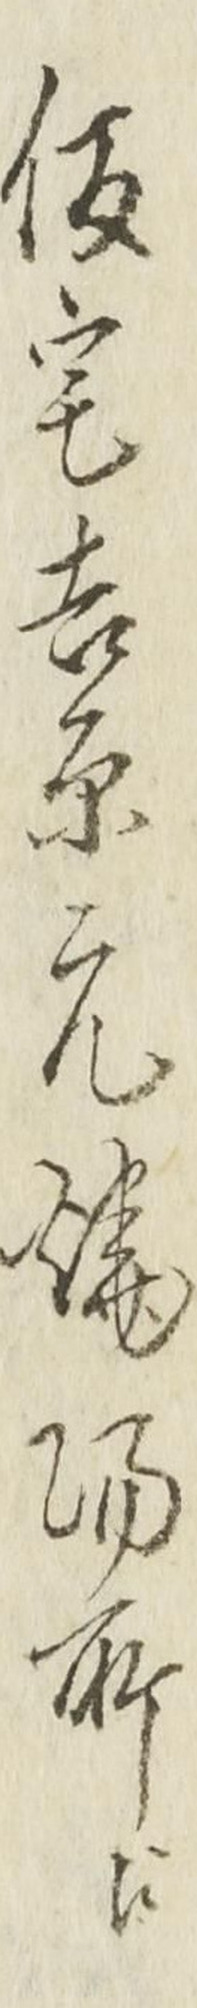仮宅吉原元焼場所え
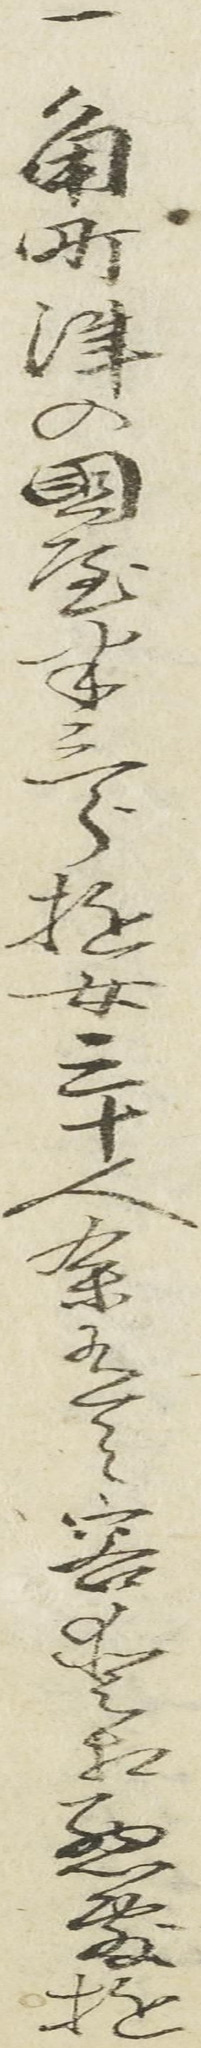一角町津の国屋半三郎遊女三十人余有之容愛相悪敷遊
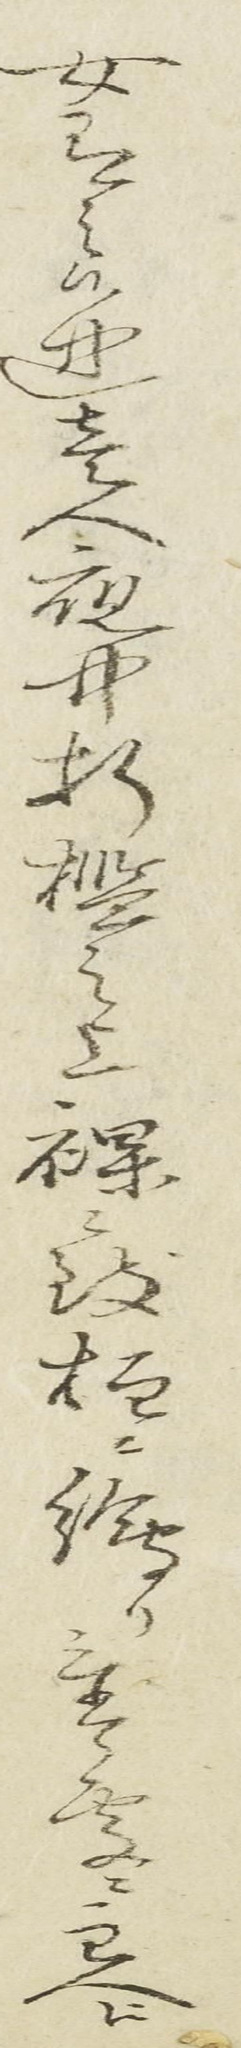女有之候迚壱人夜中折檻之上裸二致柱二縛り置候処ニ主人え
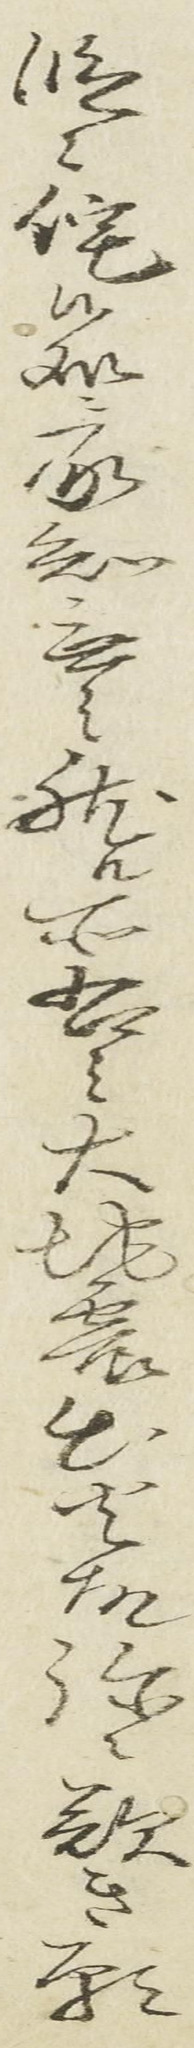段々詫候処ニ承知無之然ル所右之大地震出火故弥々嘆き願
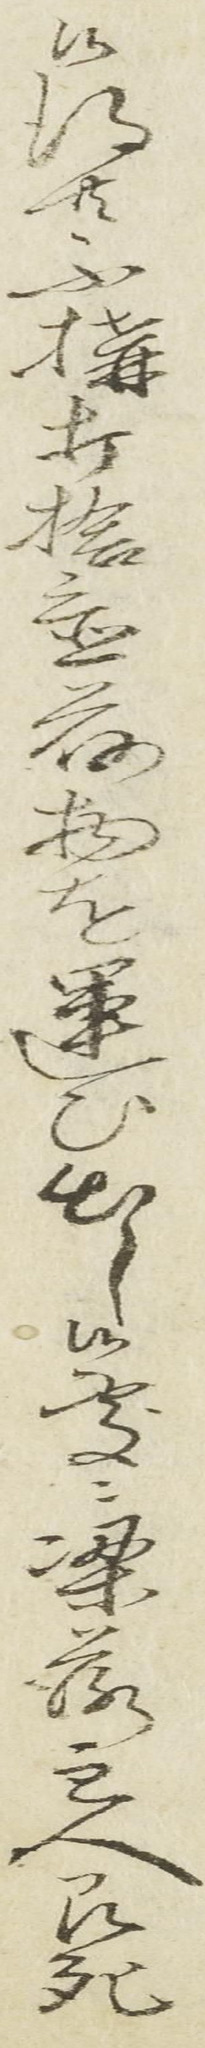候得共不構打捨置荷物を運び出し候処ニ梁落主人即死
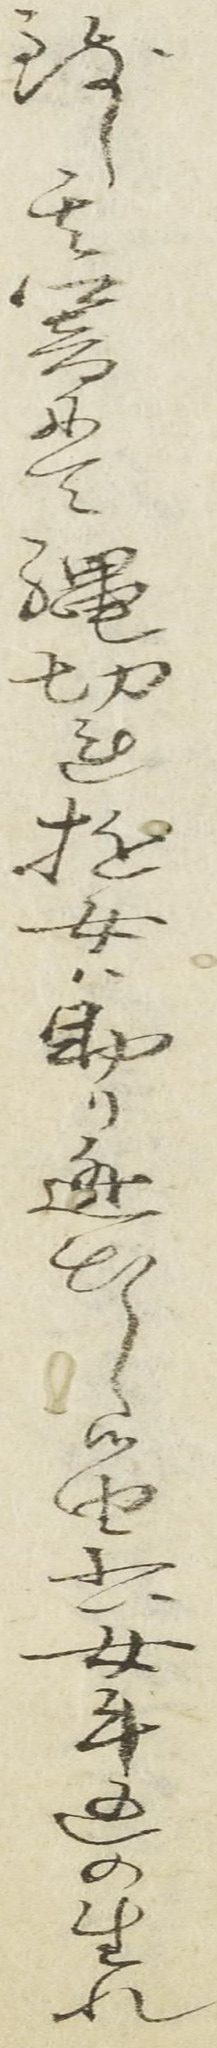致し其闇にて縄切れ遊女ハ助り逃出し候由右女牛込の生れ
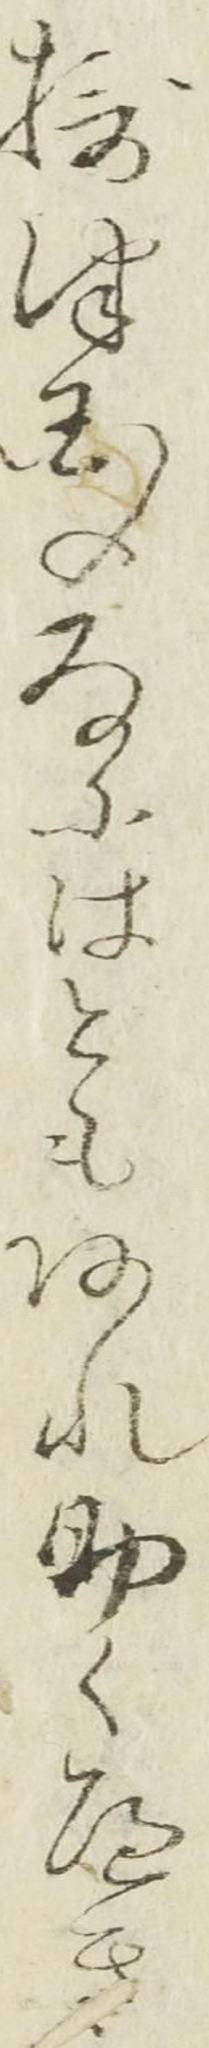摂津国のなにはともあれ助くへき
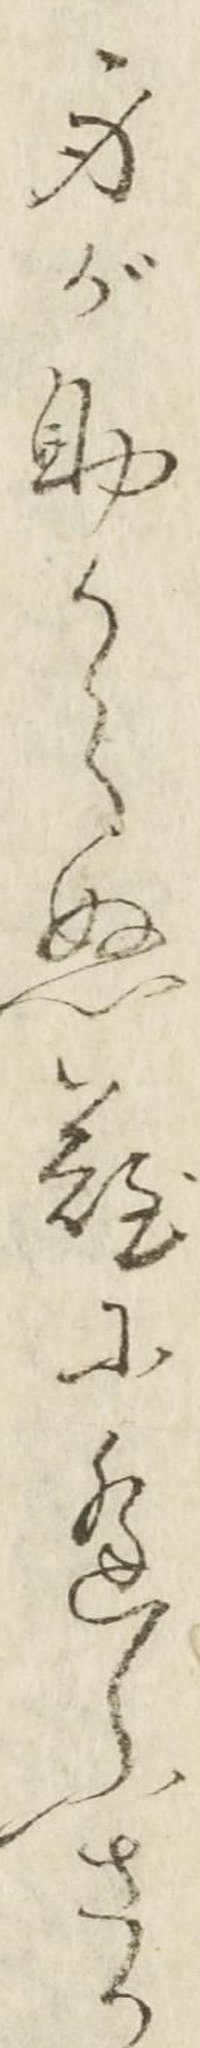身が助かりぬ難に逢うさり
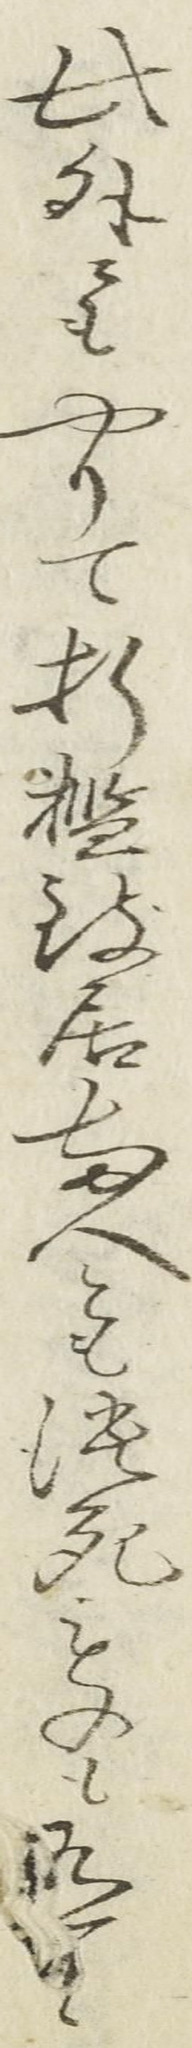此外二もゆりて折檻致居両人とも潰死ものも有之
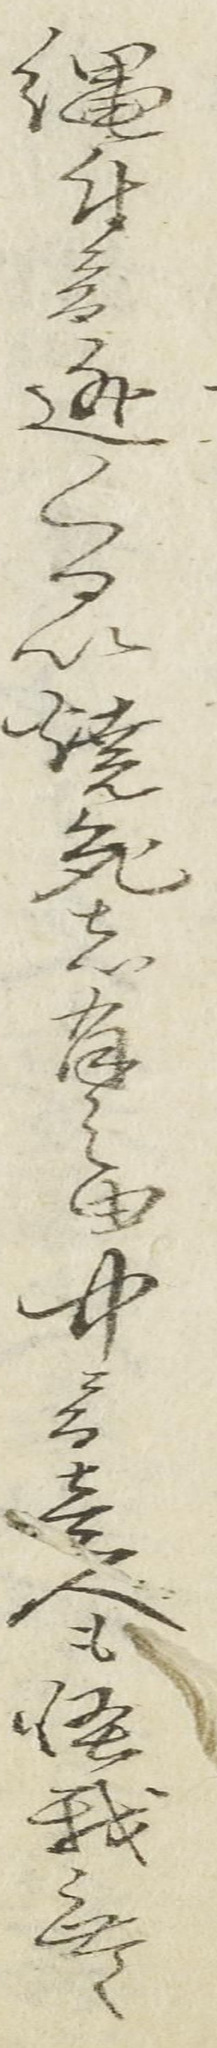縄付ニ而逃くるい焼死者有之由中ニ而壱人も怪我無之
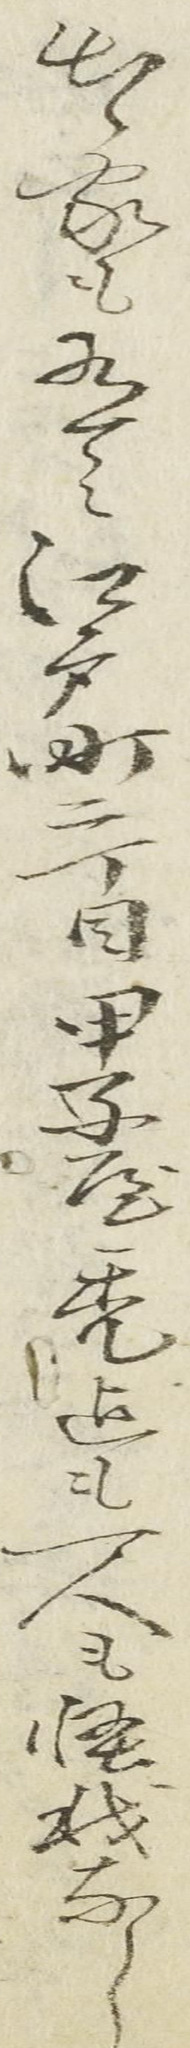出候家も有之江戸町二丁目甲子屋禿迄も一人も怪我なし
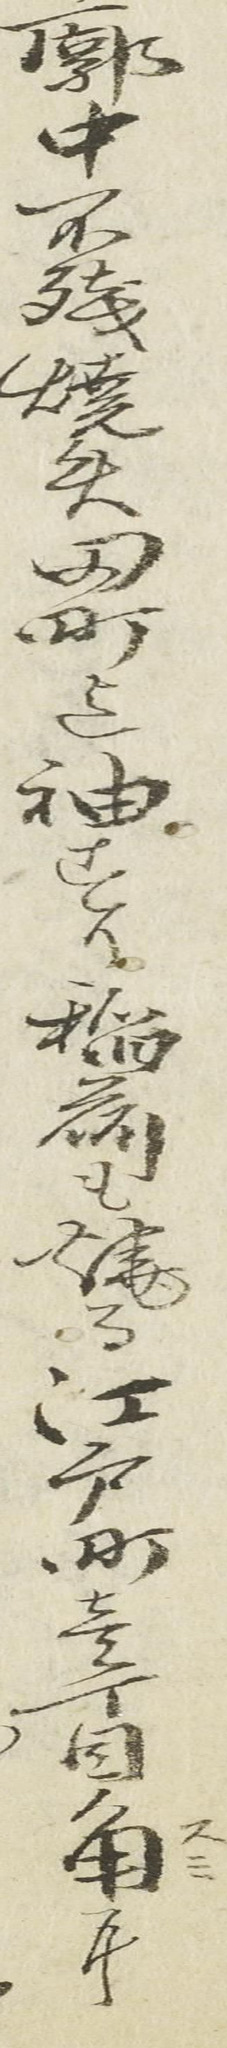郭中不残焼失田町迄袖すり稲荷も焼る江戸町壱丁目角に
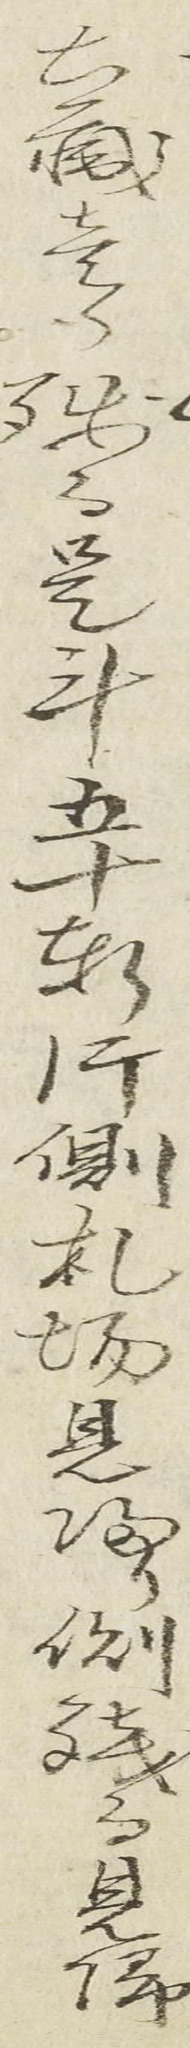土蔵壱ツ残る是斗五十軒片側札場見帰り側残る見帰
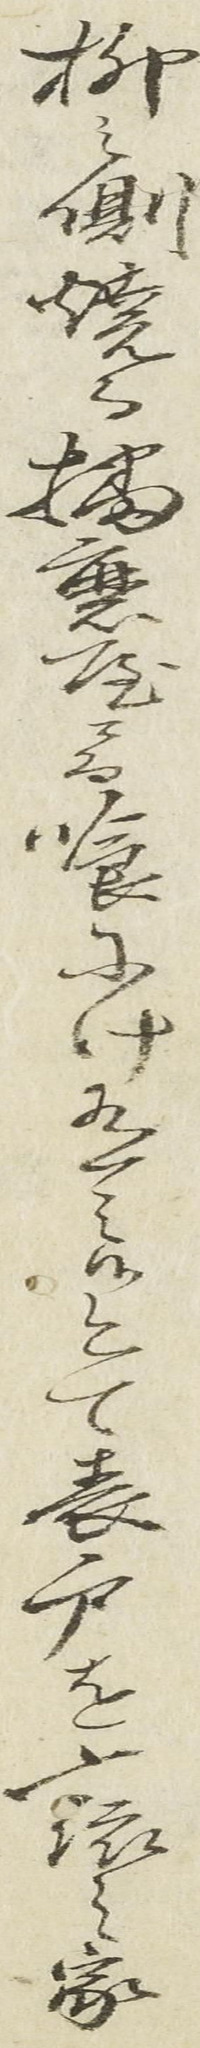柳之側焼て播磨屋にて喰にけ有之候とて表戸を〆依之家
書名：安政二乙卯年十月二日大地震之事
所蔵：東京大学地震研究所図書室 Earthquake Research Institute Library, The University of Tokyo, JAPAN
